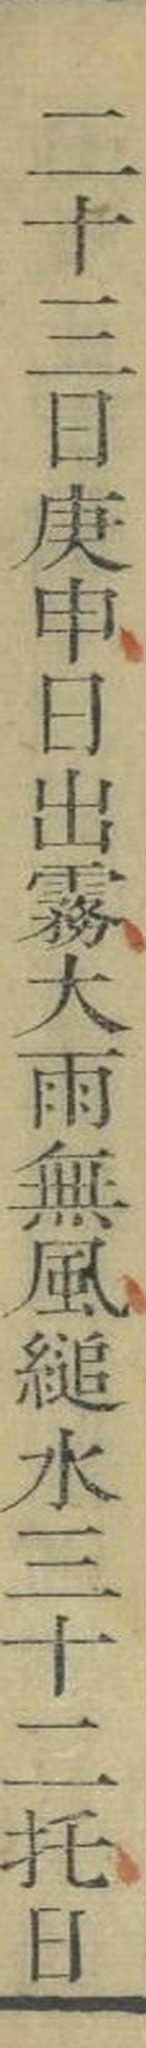二十三日庚申日出霧大雨無風縋水三十二托日
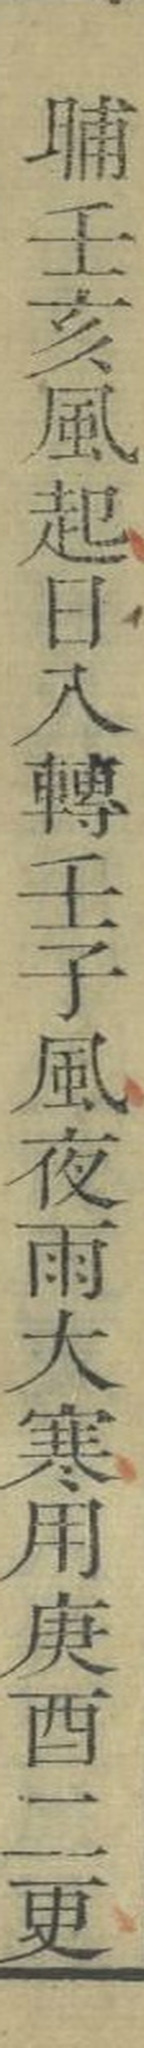晡壬亥風起日入轉壬子風夜雨大寒用庚酉二更
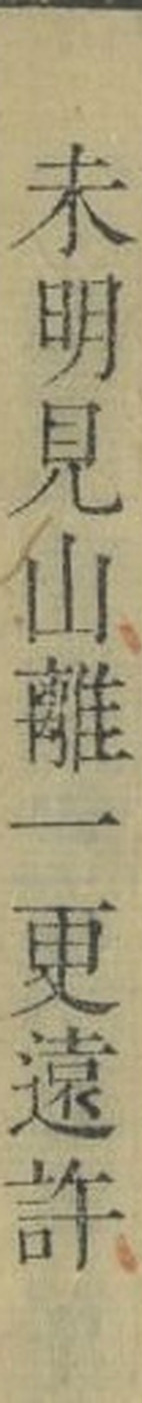未明見山離一更遠許
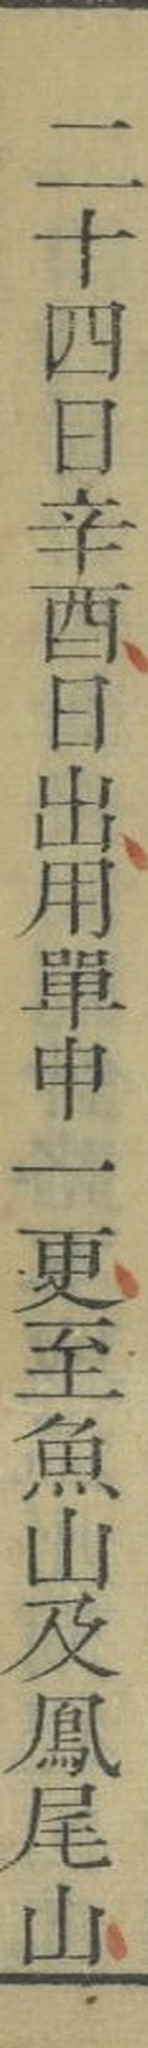二十四日辛酉日出用單申一更至魚山及鳳尾山

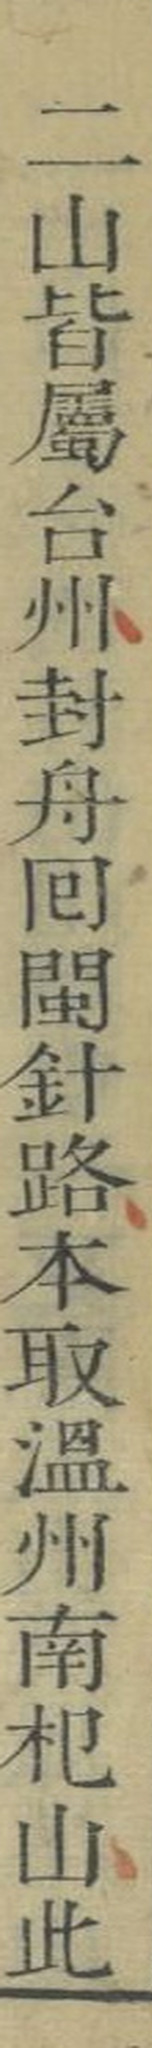二山皆屬台州封舟囘閩針路本取溫州南杞山此
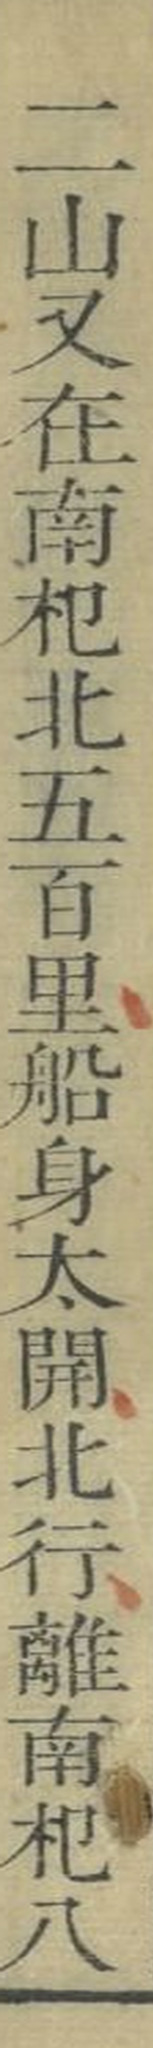二山又在南杞北五百里船身太開北行離南杞八
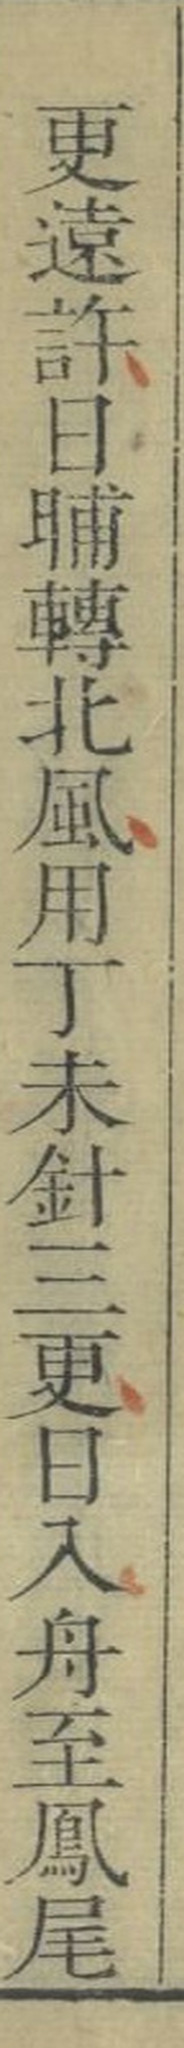更遠許日晡轉北風用丁未針三更日入舟至鳳尾
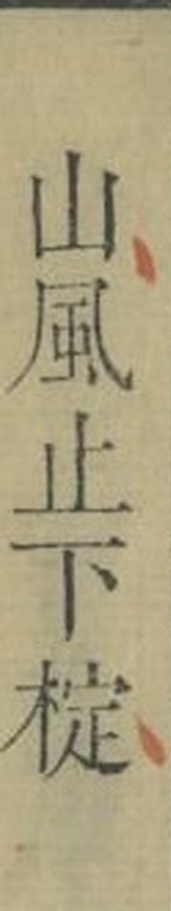山風止下椗
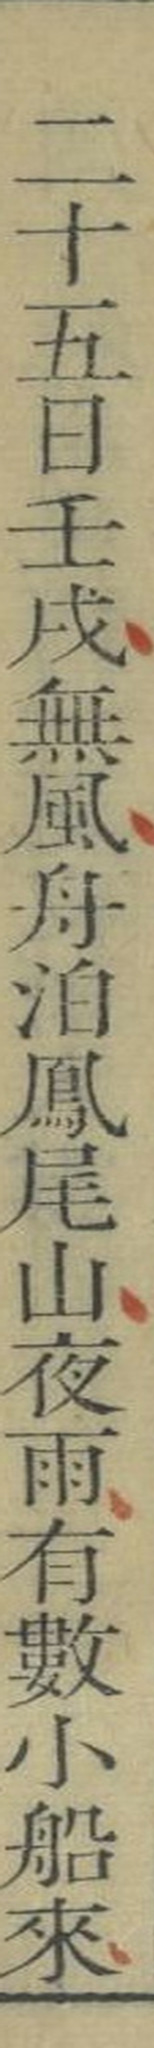二十五日壬戌無風舟泊鳳尾山夜雨有數小船來
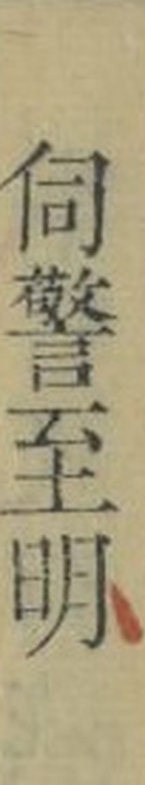伺警至明
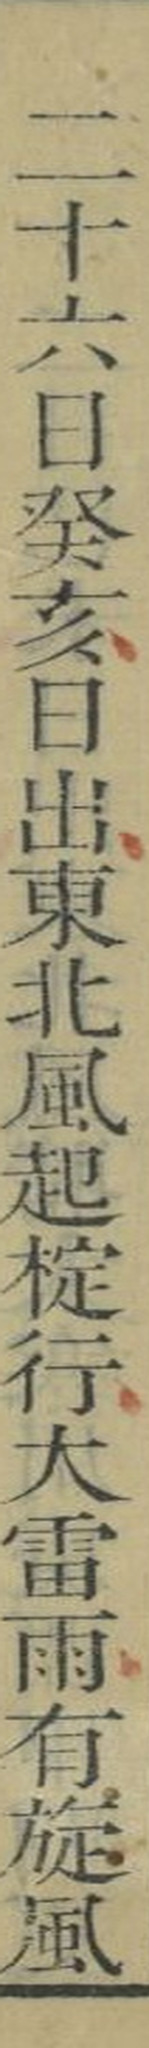二十六日癸亥日出東北風起椗行大雷雨有旋風
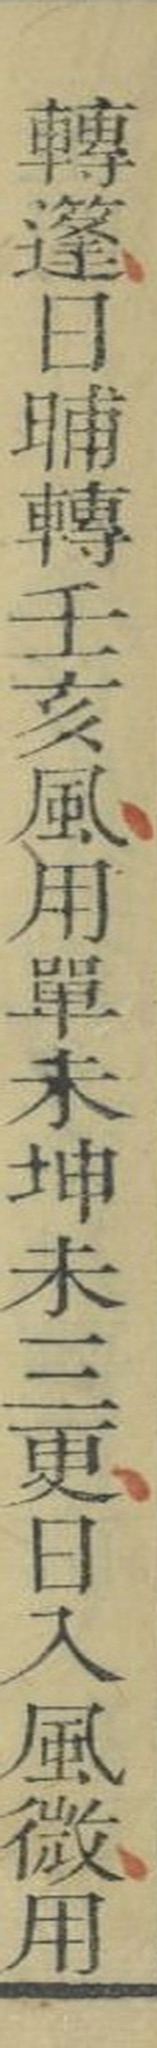轉篷日晡轉壬亥風用單未坤未三更日入風微用
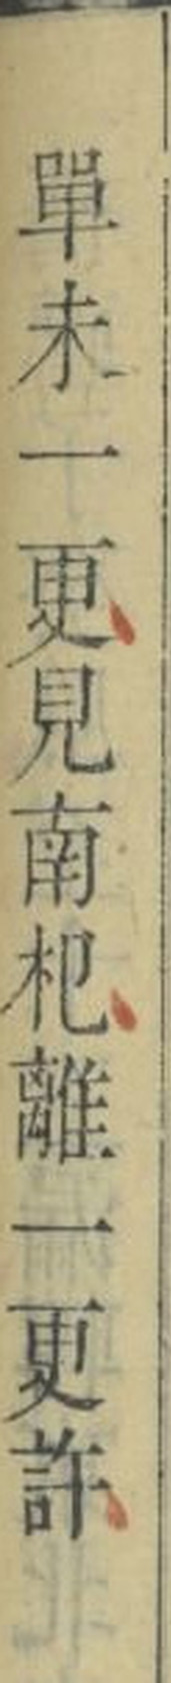單未一更見南杞離一更許
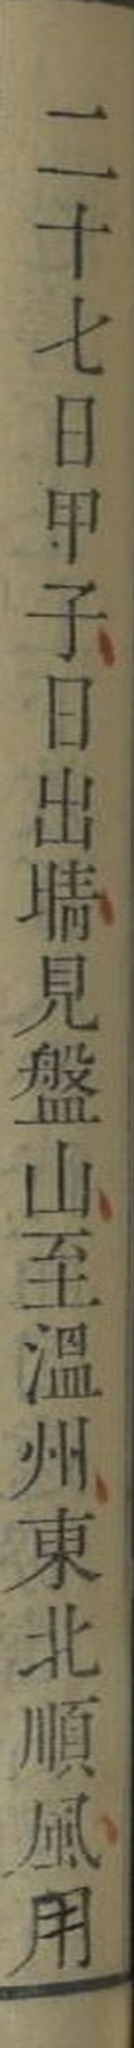二十七日甲子日出晴見盤山至溫州東北順風用
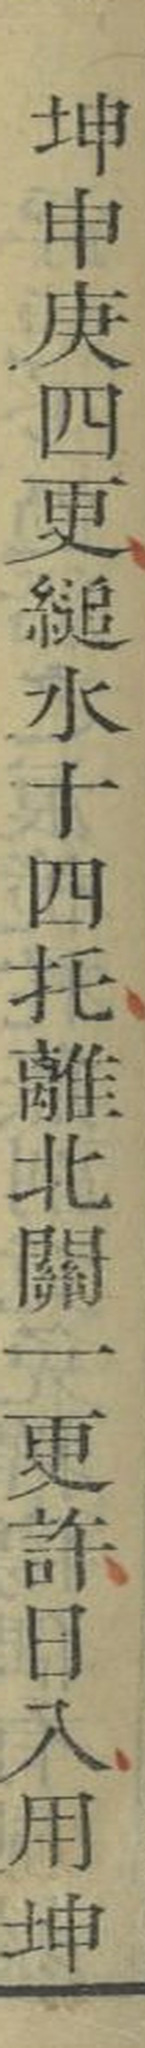坤申庚四更縋水十四托離北關一更許日入用坤
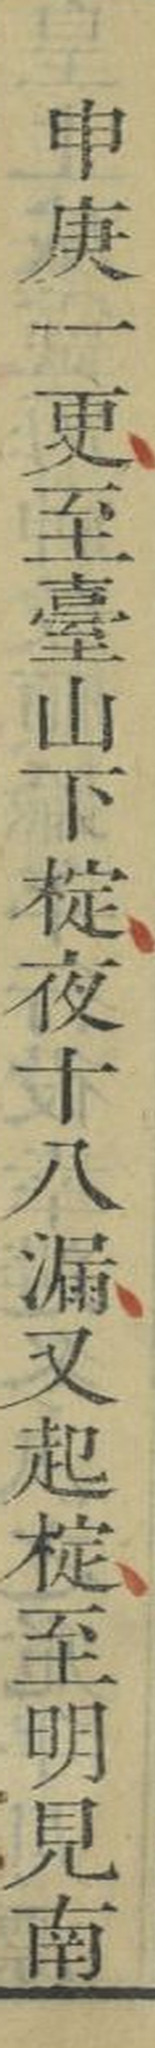申庚一更至臺山下椗夜十八漏又起椗至明見南
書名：中山伝信録 巻一、巻二
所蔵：University of the Ryukyus Library
